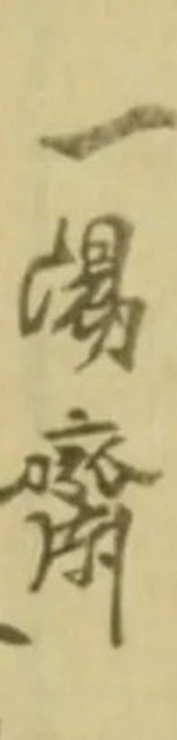一陽斎
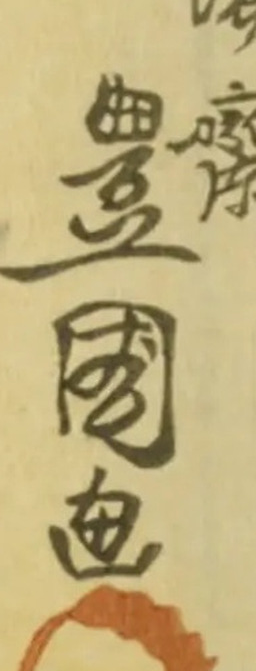豊国画
